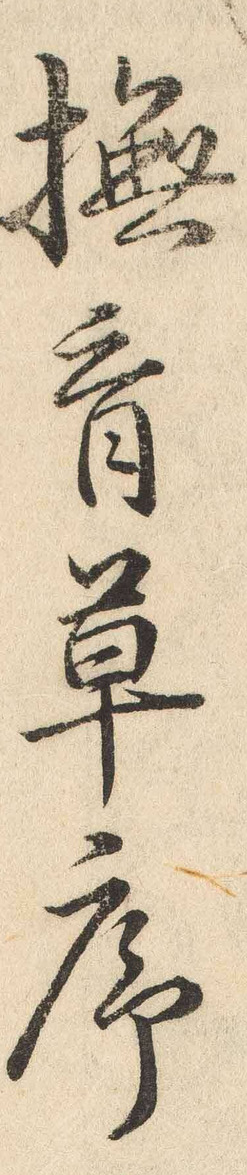撫育草序

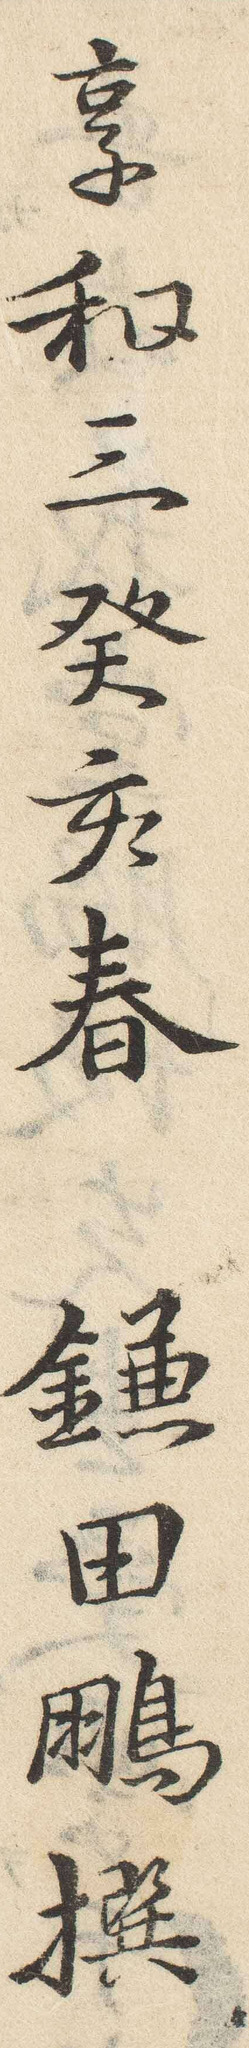享和三癸亥春鎌田鵬撰
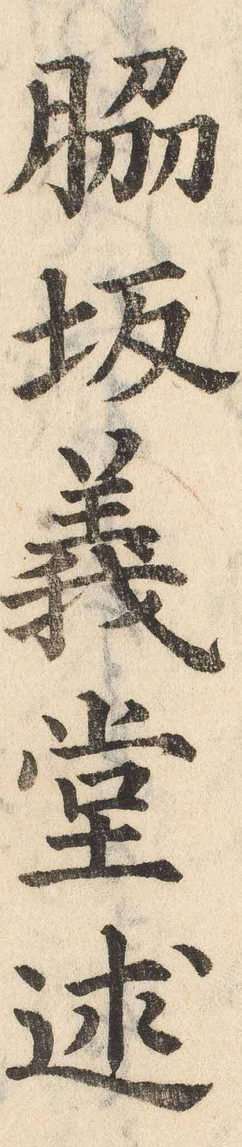脇坂義堂述
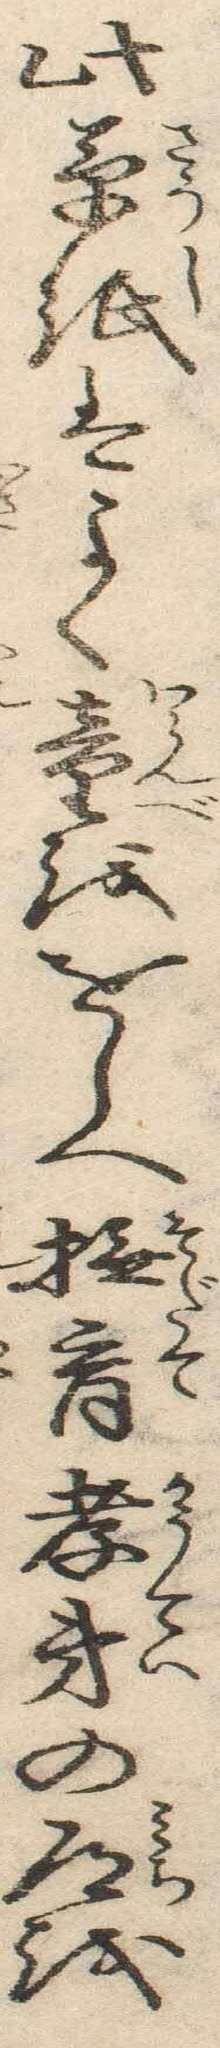此草紙はよく童ををしへ撫育孝弟の道を
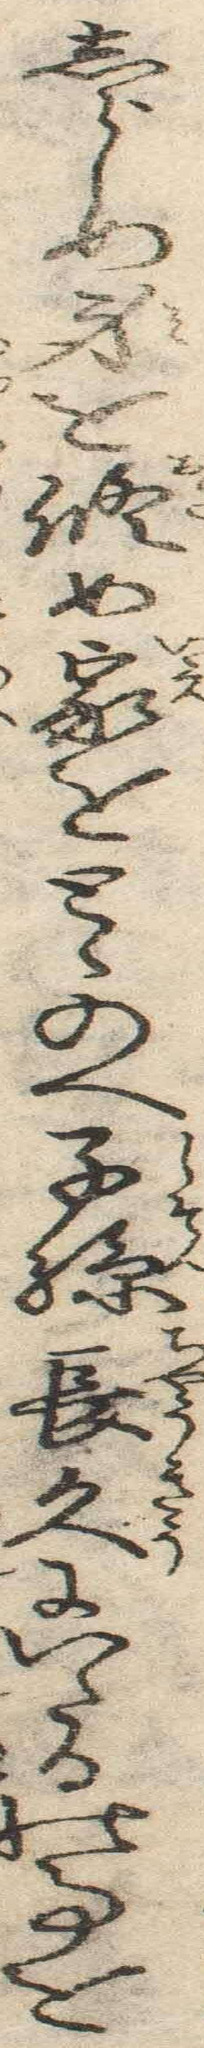しらしめ身を修め家をとゝのへ子孫長久にいたるの事を
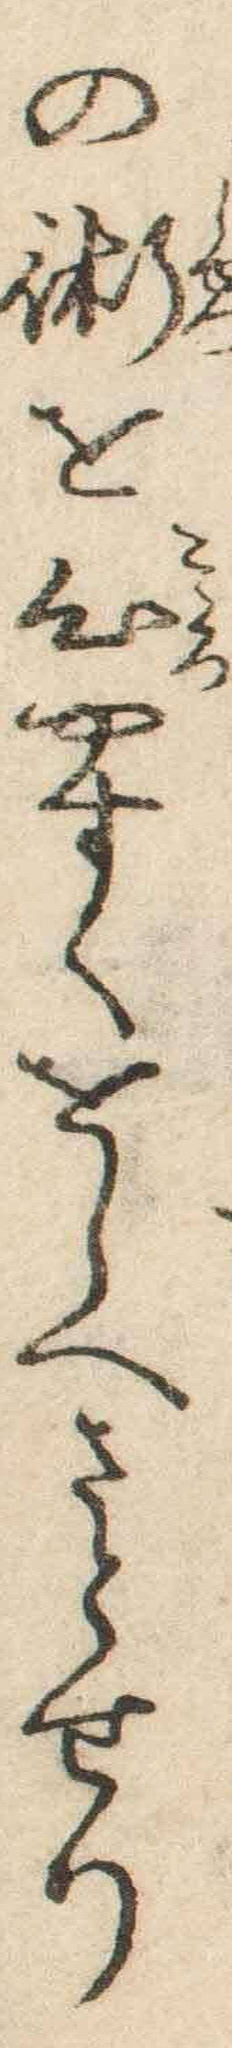の術を心やすくをしへさとせり
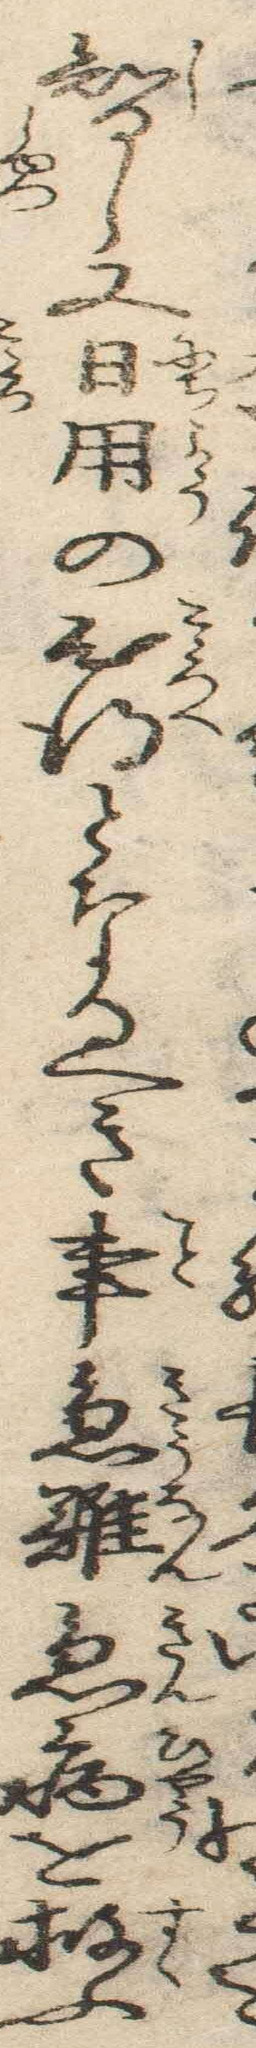知るし又日用の心得となるへき事急難急病を救ふ

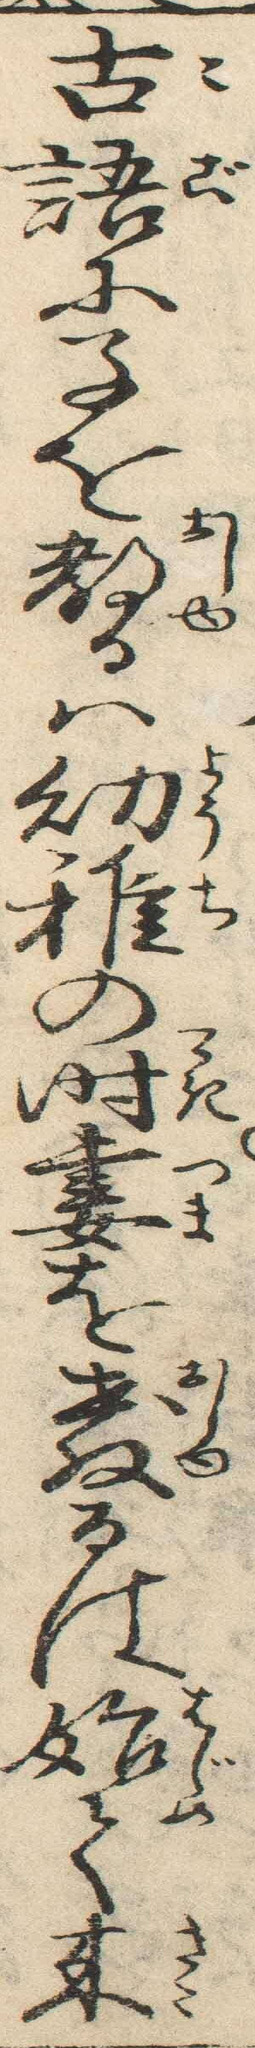古語に子を教るは幼稚の時。妻を教るは始て来
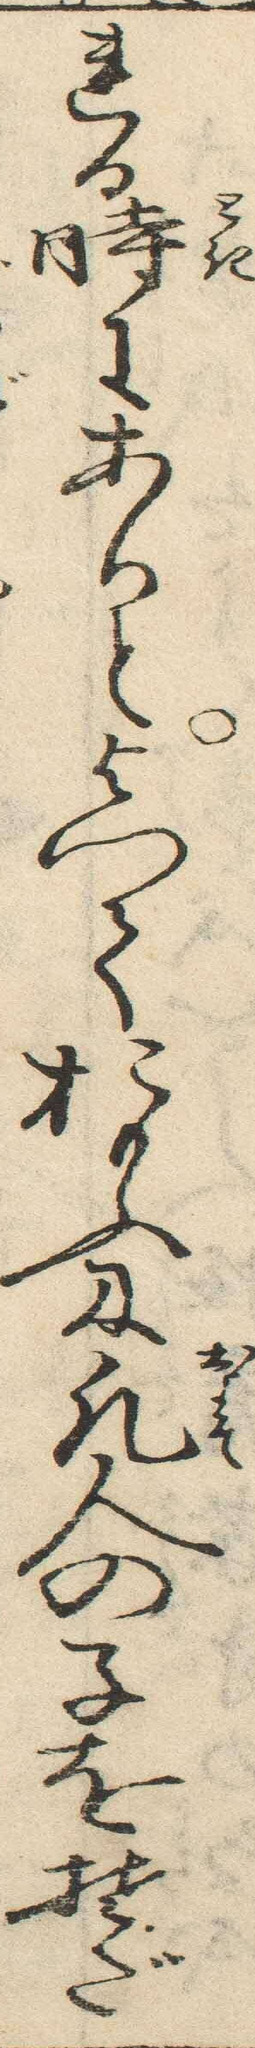れる時にありと。よつておもふに凡人の子をそだ
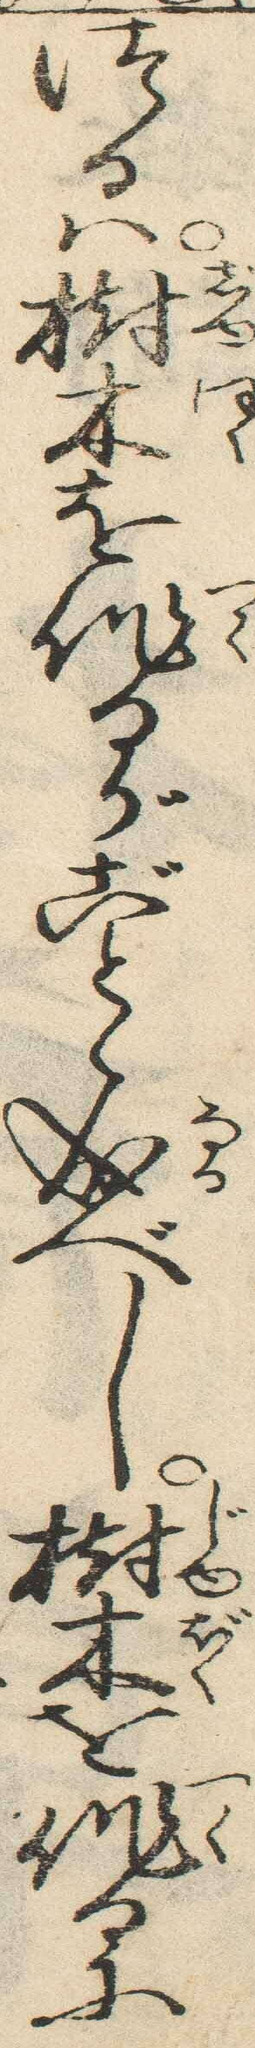つるは。樹木を作るがごとく成べし。樹木を作るに
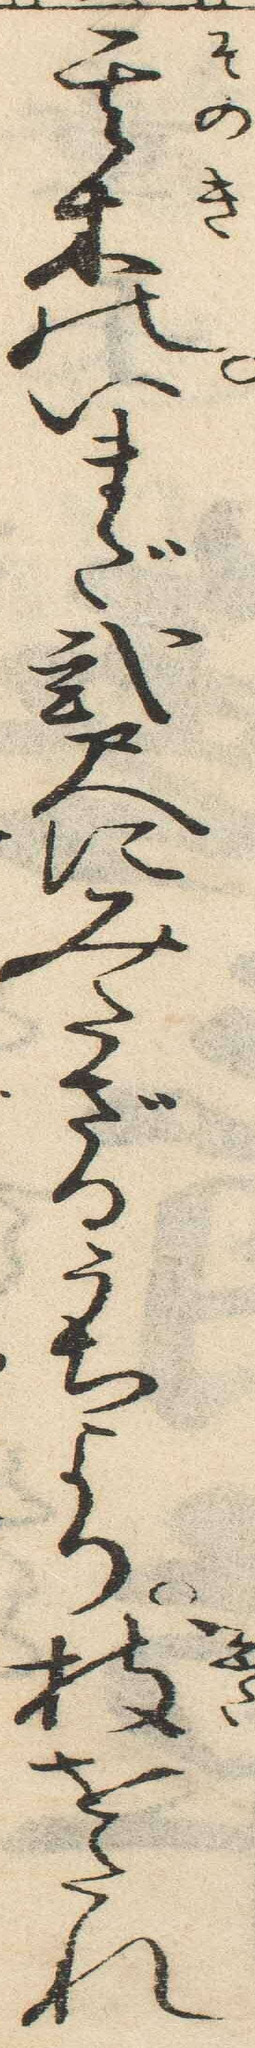其木の。いまだ弐尺にみたざるうちより。枝をたれ
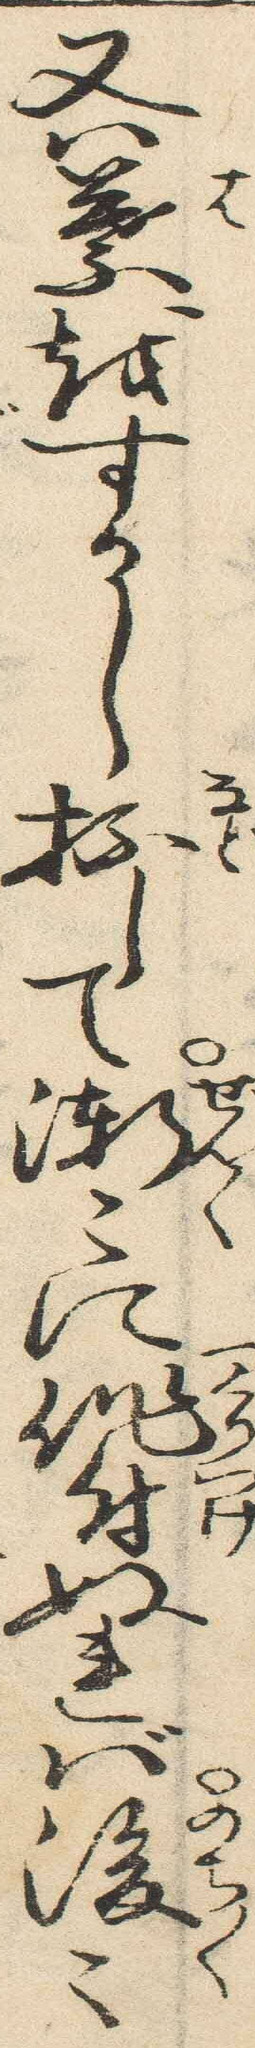又は葉をすかし抔して。漸々に作付ぬれば。後々
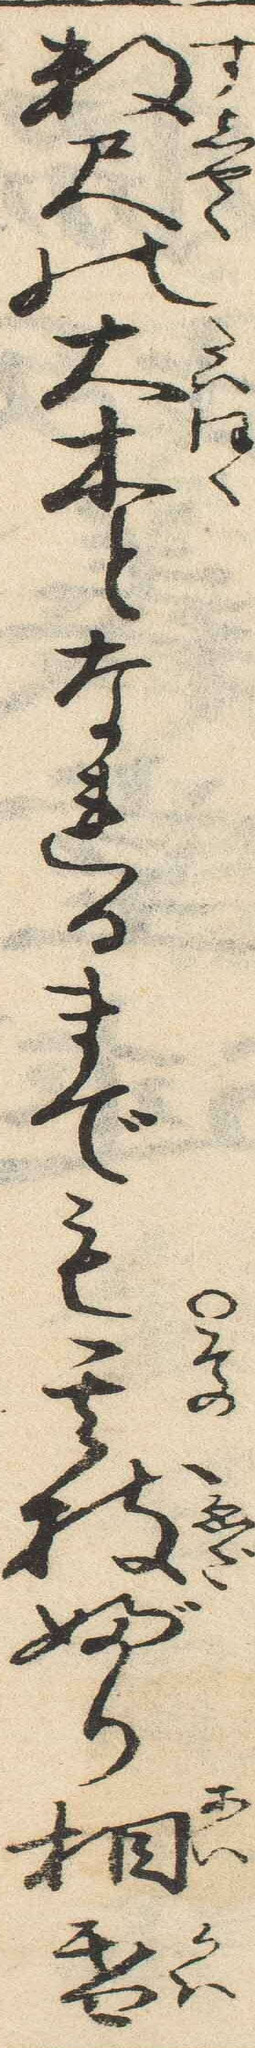数尺の大木となれるまでも。其枝ぶり相替
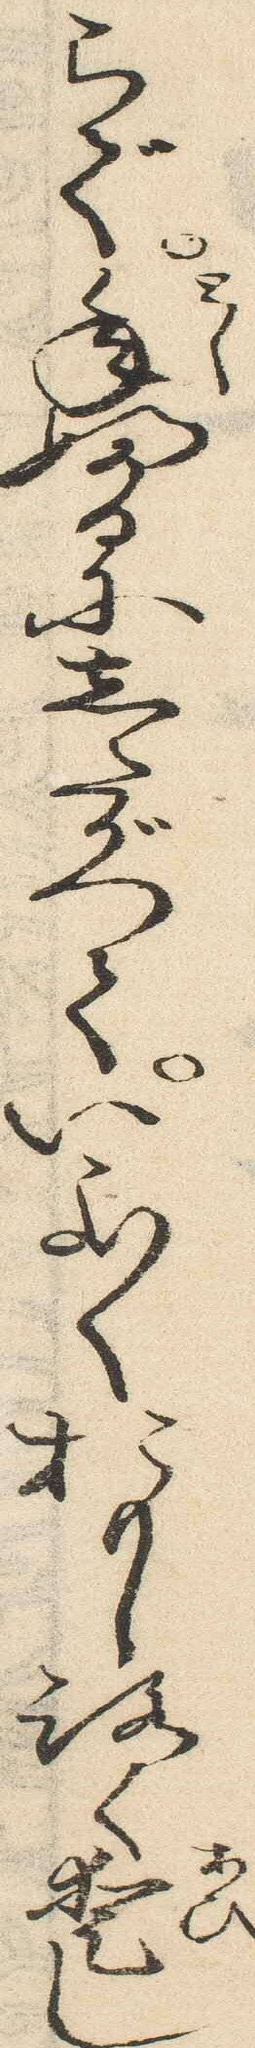らで。年ふるにしたがつて。いよ〳〵おもしろく愛し
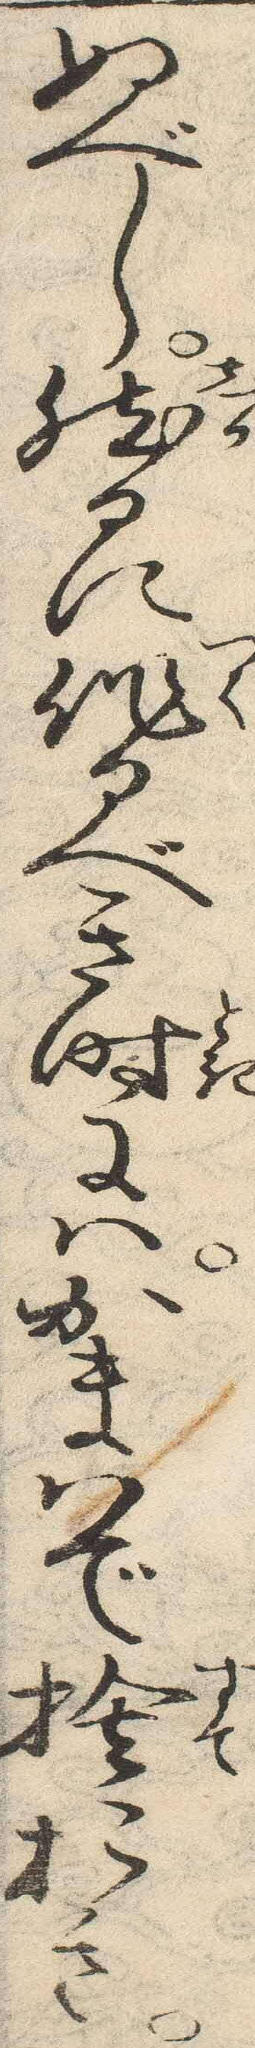ぬべし。然るに作るべき時には。かまはで捨おき。
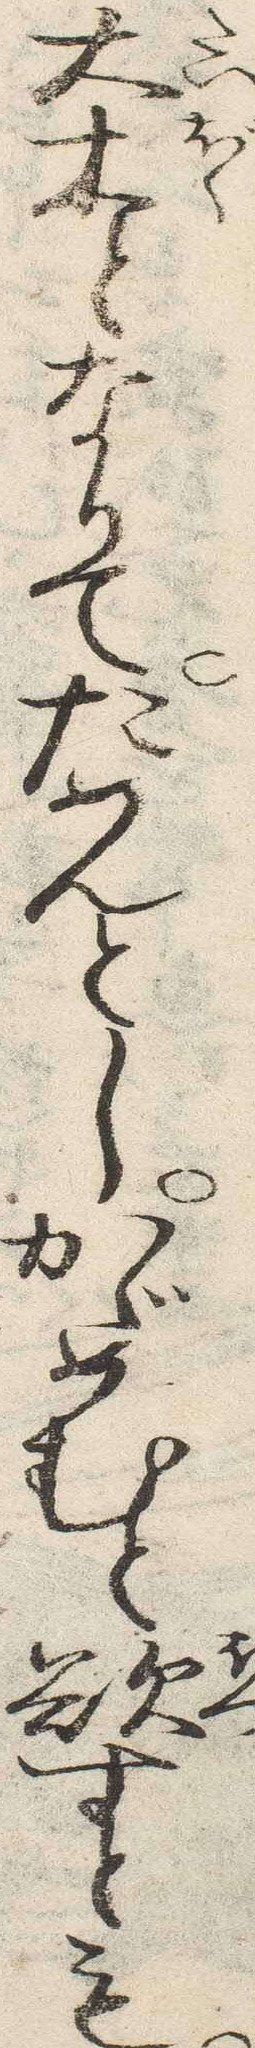大木となりて。ためんとし。かゞめむと欲すとも。
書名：撫育草
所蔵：東京学芸大学附属図書館 国文学研究資料館
